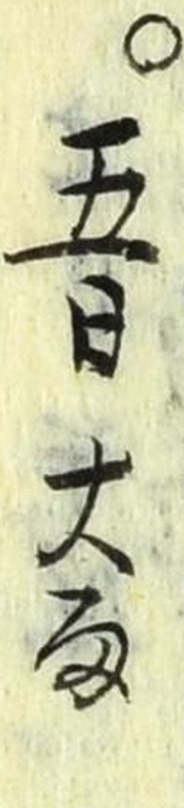六日大雨
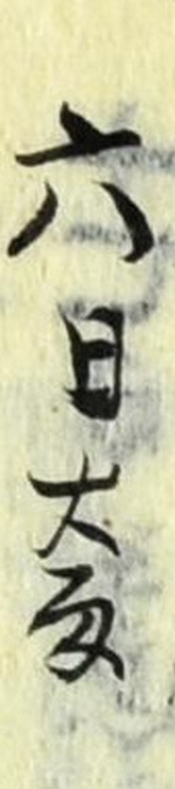六日大雨
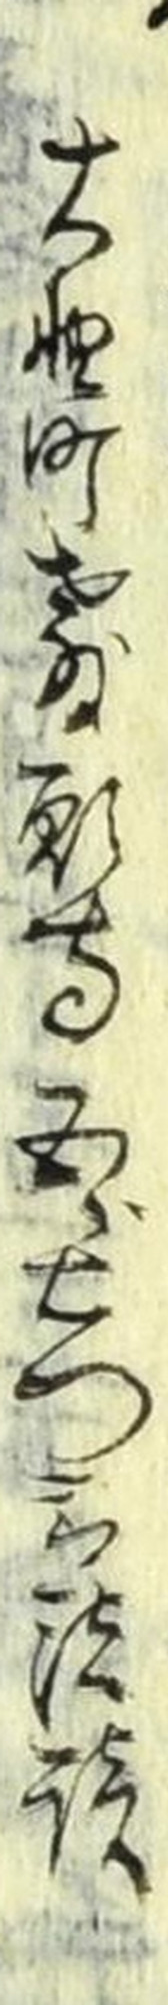大野町教願寺五郎右衛門に而法談
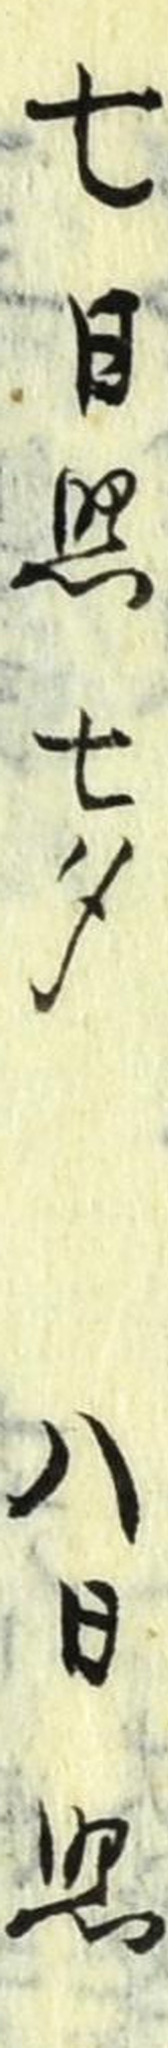七日照七夕八日照
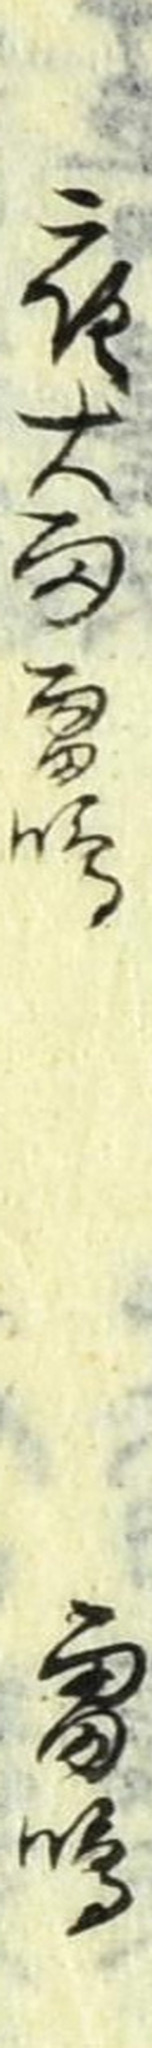夜大雨雷鳴雷鳴
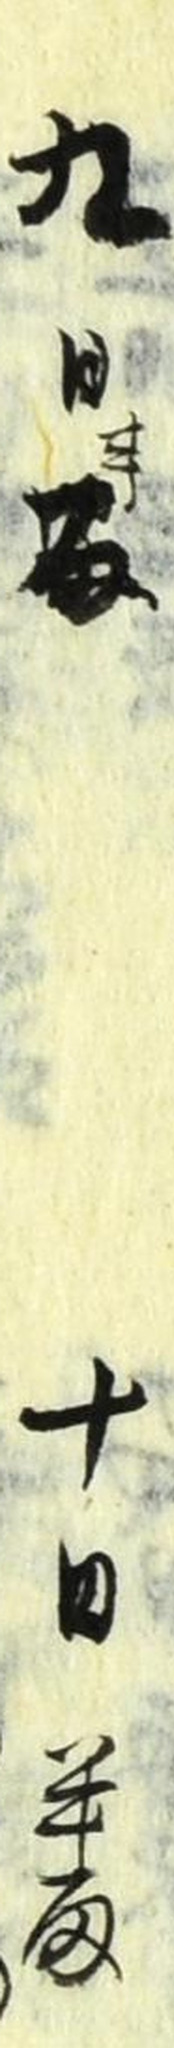九日半雨十日半雨

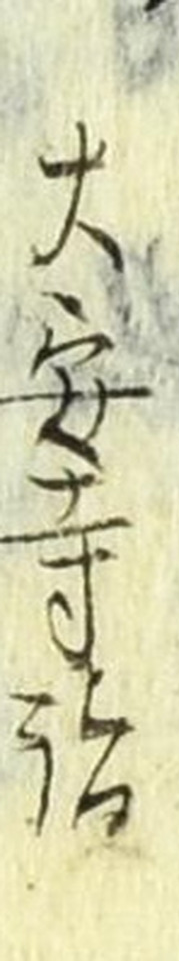大安寺詣
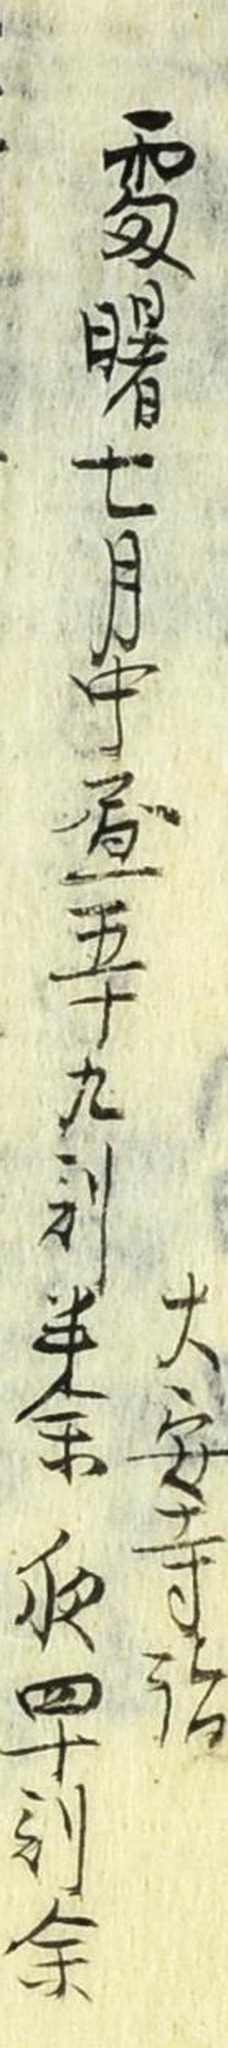処曙七月中昼五十九刻半余夜四十刻余
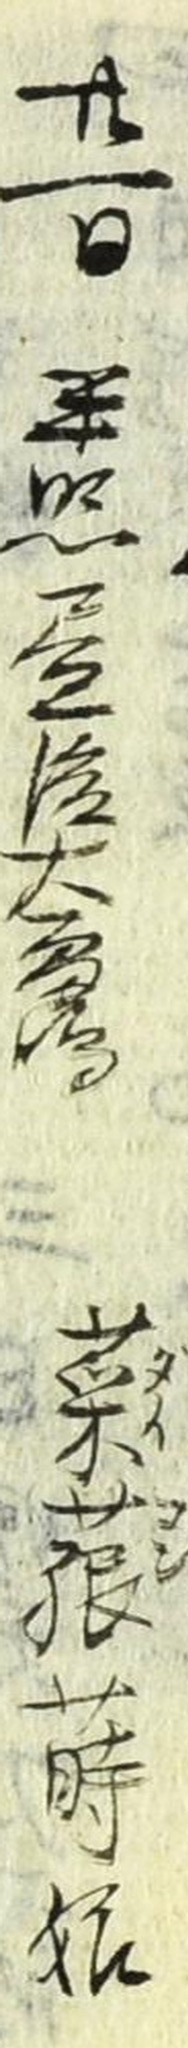廿一日半照昼後大雷鳴菜菔蒔始
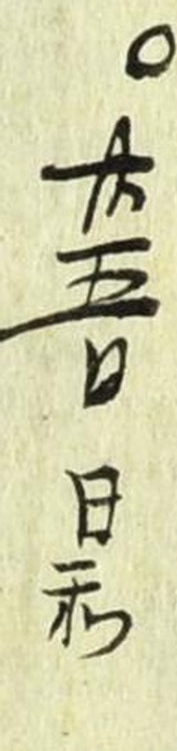廿七日日和
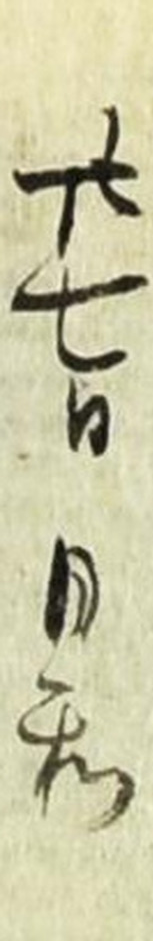廿七日日和
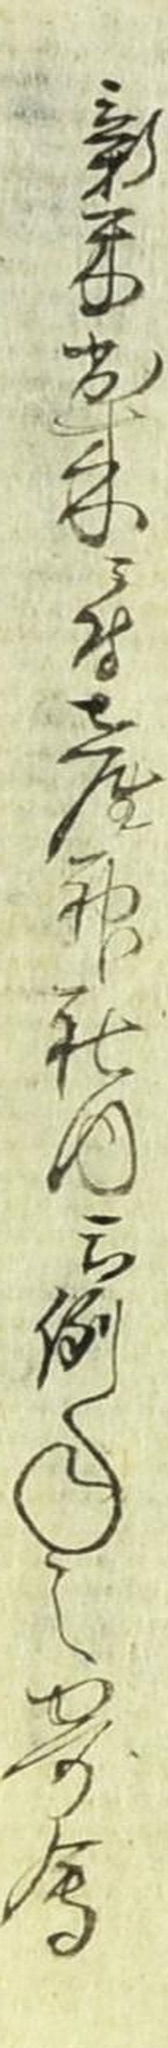新米出来に付産神社内に而例年之寄会
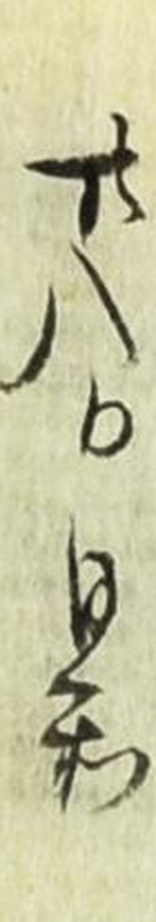廿八日日和
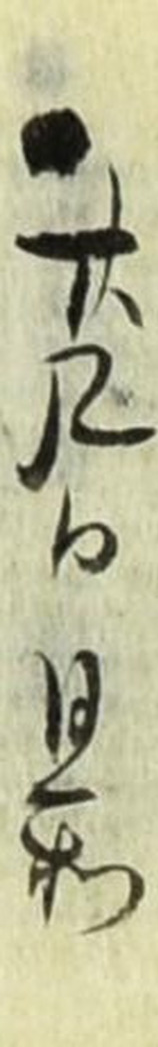●廿九日日和
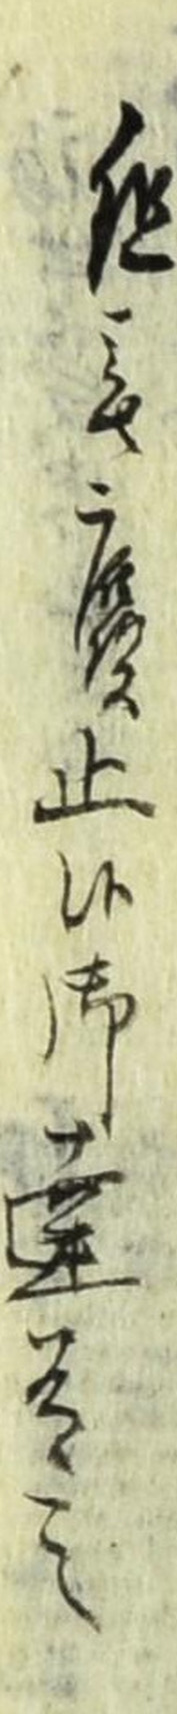組被廃止候御達有之

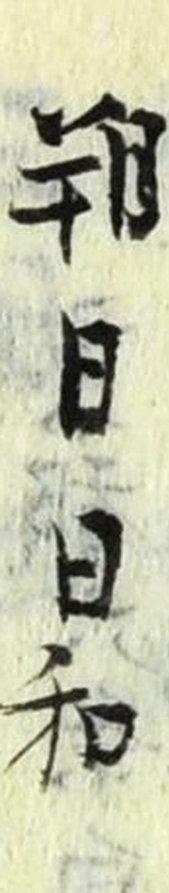三日日和
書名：（日記）
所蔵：福井県文書館 Fukui Prefectural Archives
